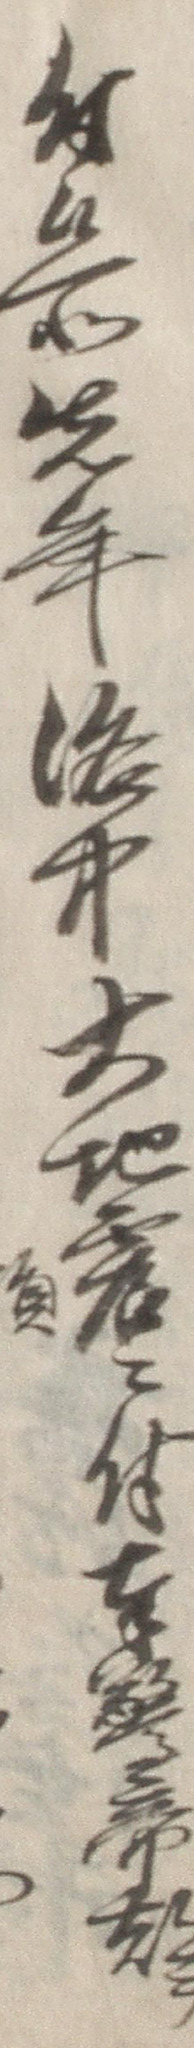付候所先年洛中大地震二付驚帝都ヲ
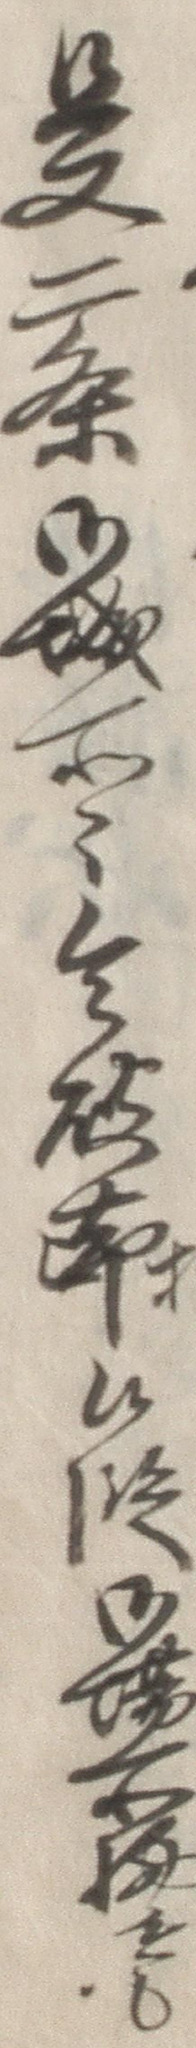且又二条御城所々今破損候段御場所柄をも
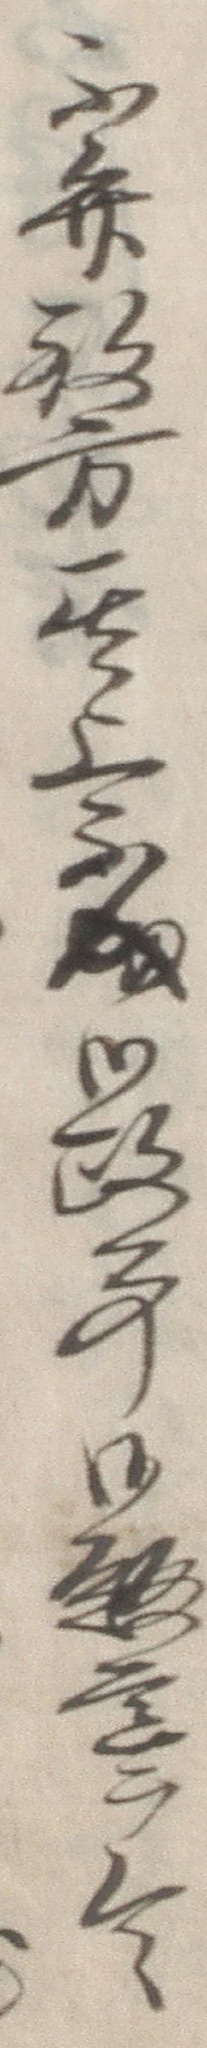不弁致方其上不成御政事御趣意ヲ今
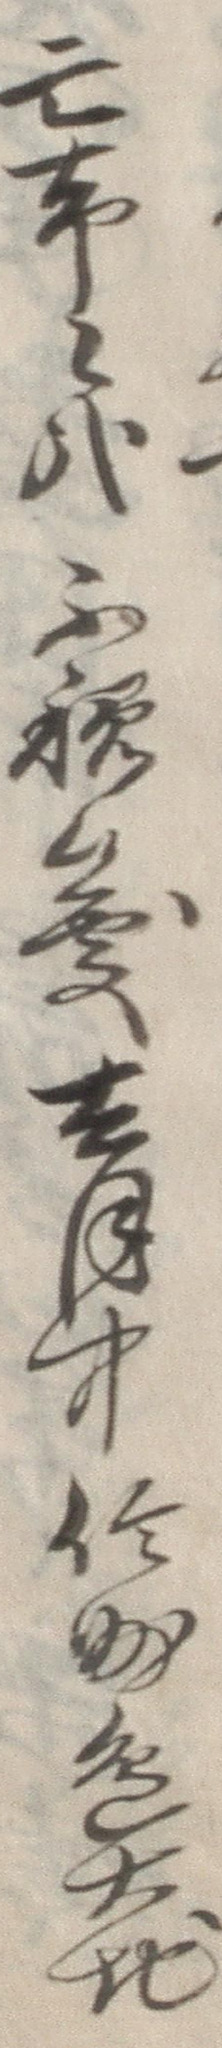忘却候哉不穏候処去月中信州辺大地
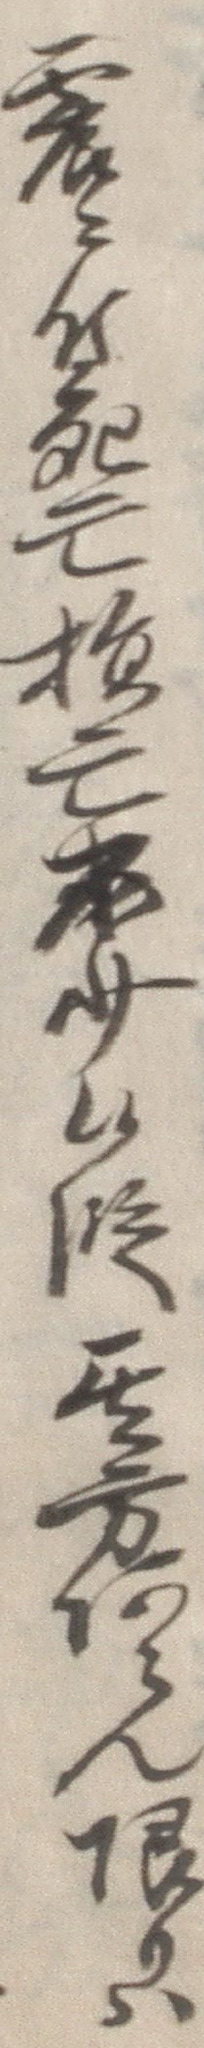震二付死亡損亡不少候段其方あらん限りハ
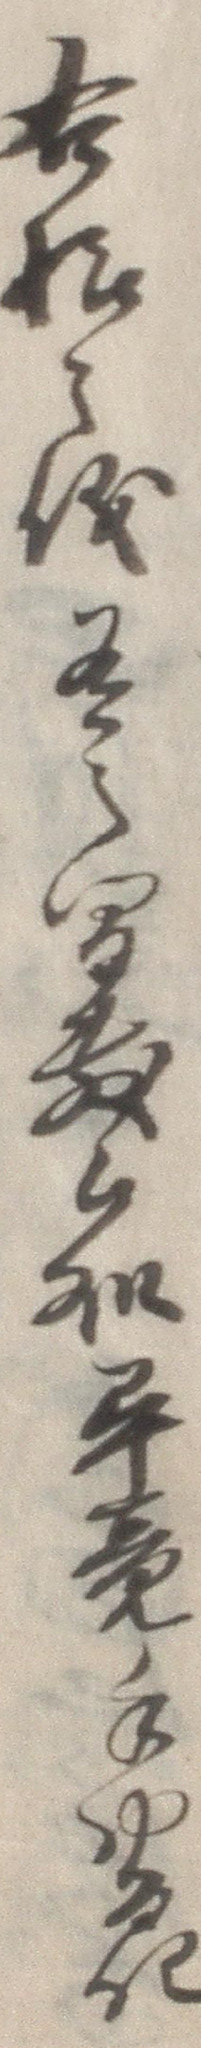右様之儀有之間敷候処畢竟手ゆるき
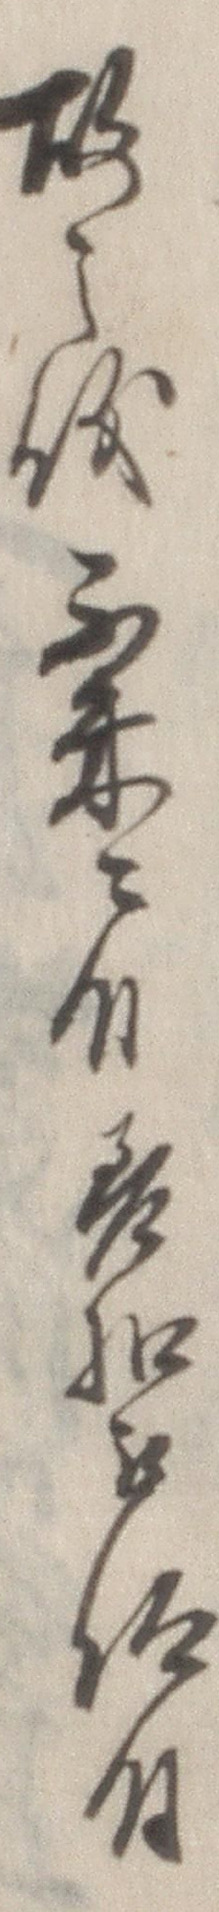故之儀不成二付差扣被仰付
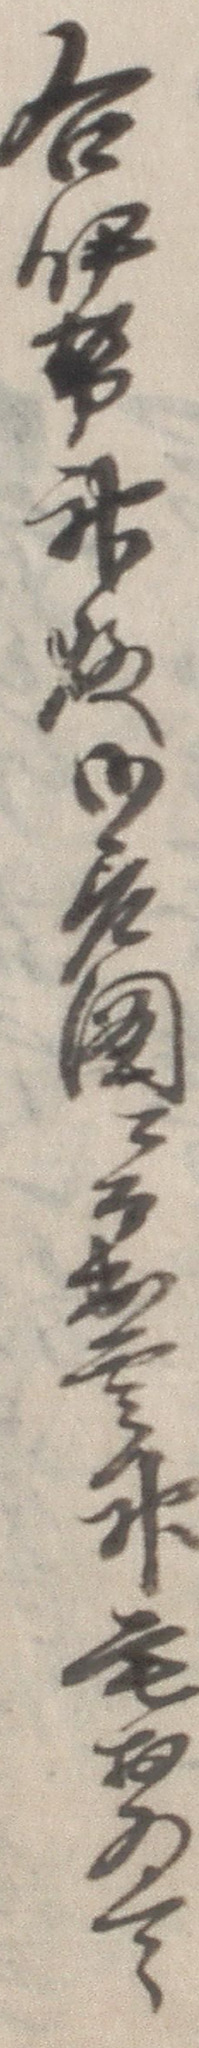右伊勢神殿御差図二而出雲神宅おゐて
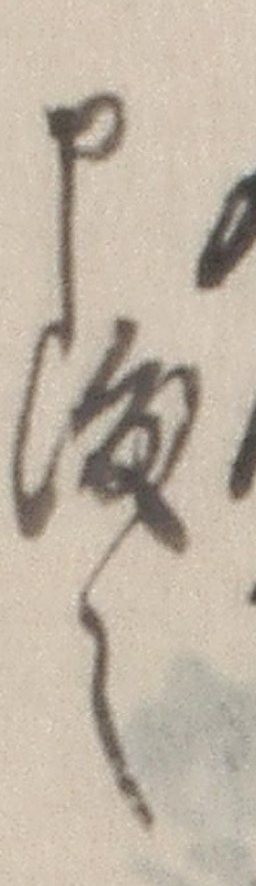申渡之
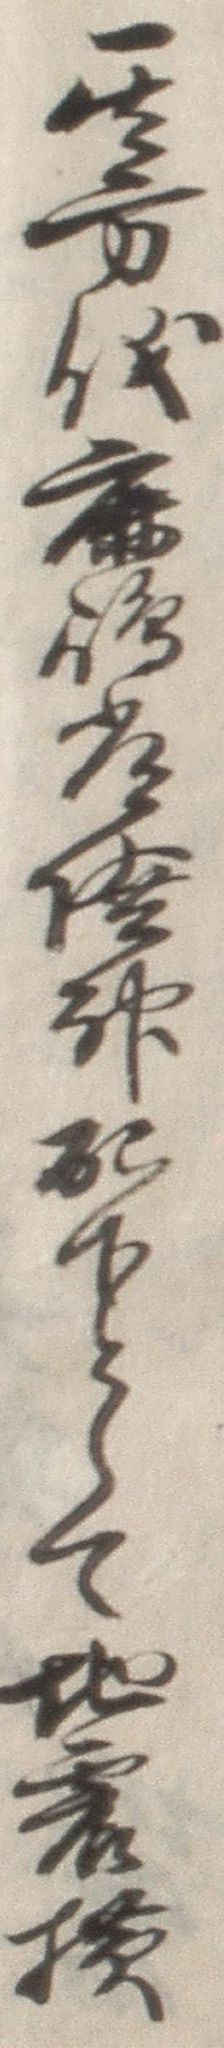其方儀廉嶋常陸神配下として地震損
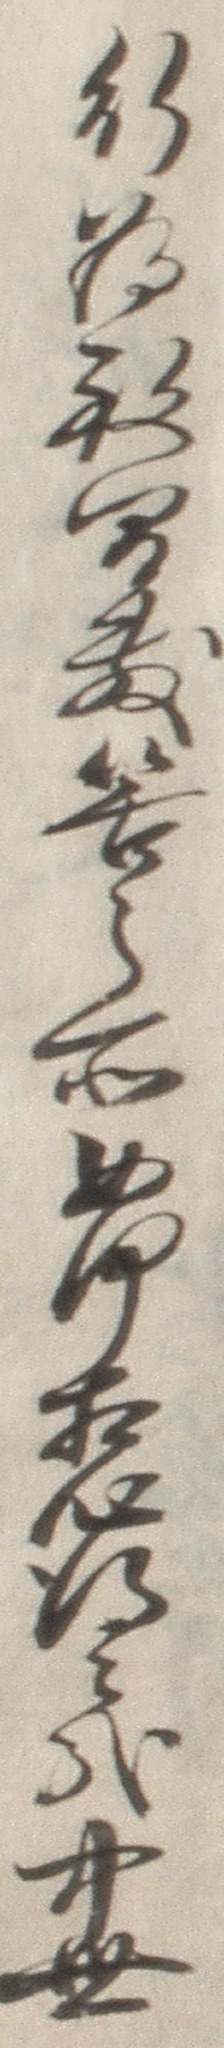行為致間敷筈之所如何相心得候哉中世
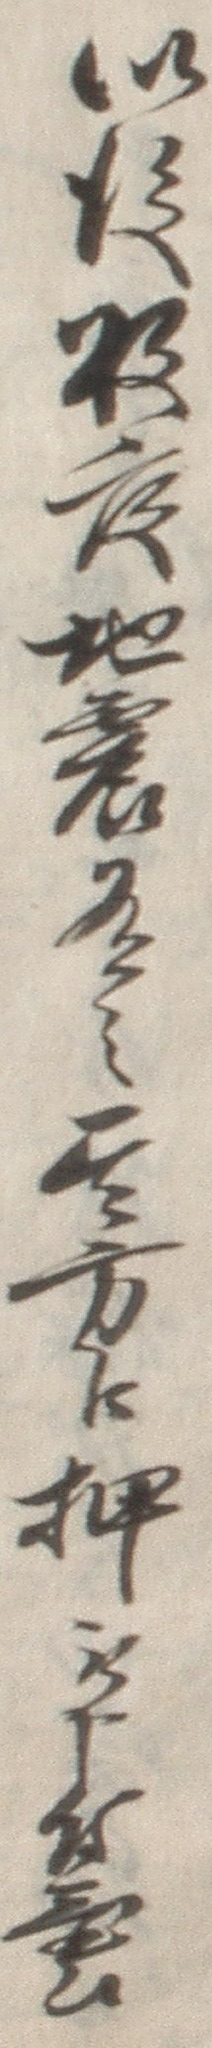以後数度地震有之其方江押被申付置候
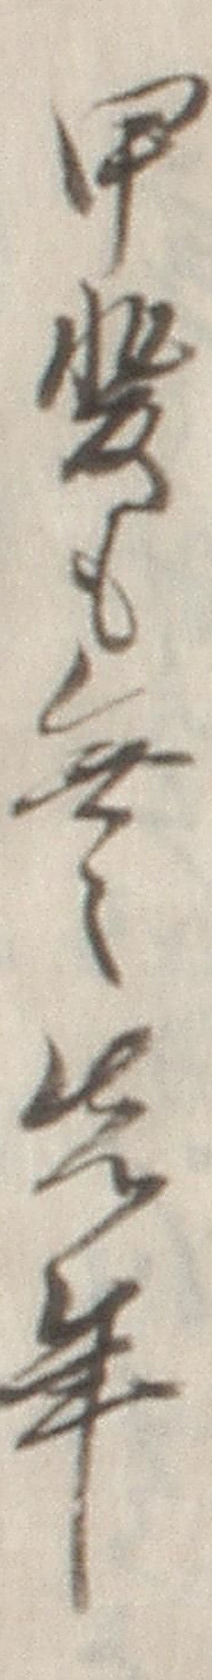甲斐も無之先年
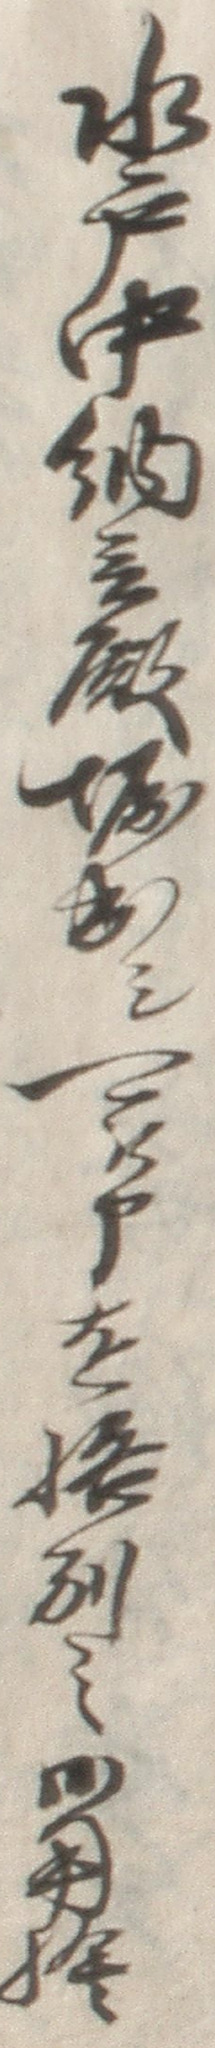水戸中納言殿堀出ㇱ可被申を格別之御用捨
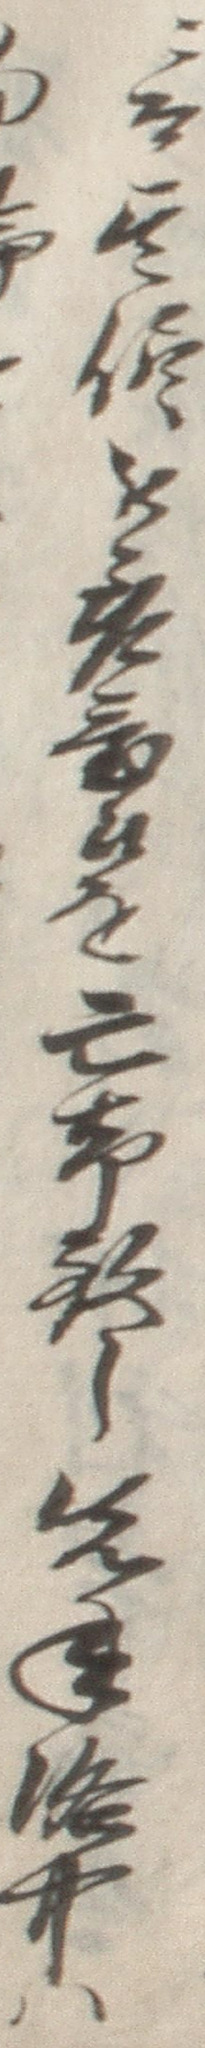二而其儘被差置候を忘却致し先年洛中ハ
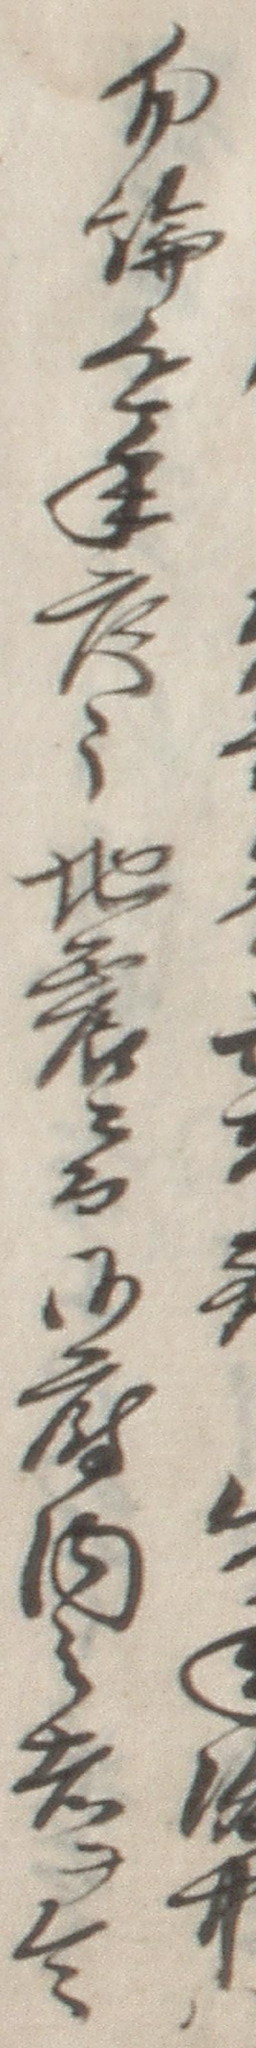勿論近年夜々地震二而御府内之者ヲ今
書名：信州地震一件
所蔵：東京大学地震研究所図書室 Earthquake Research Institute Library, The University of Tokyo, JAPAN
